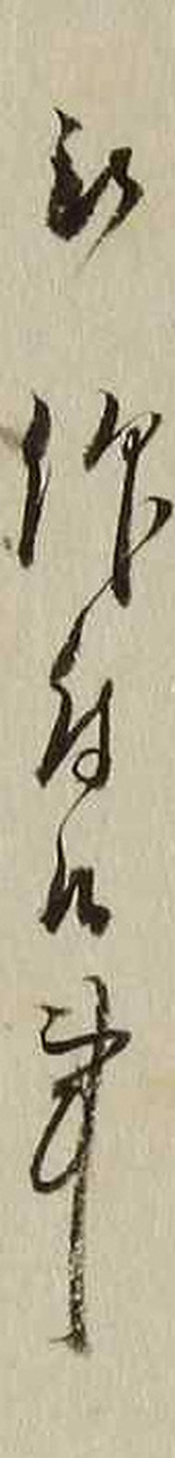被仰付候事
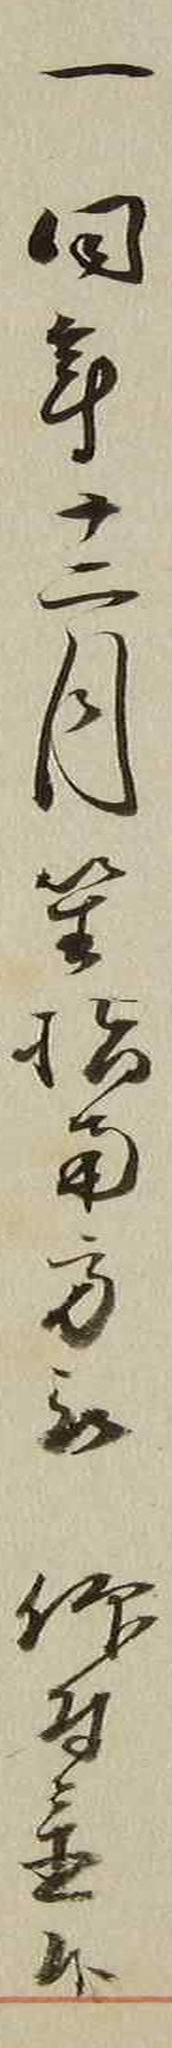一同年十二月笙指南方被仰付置候
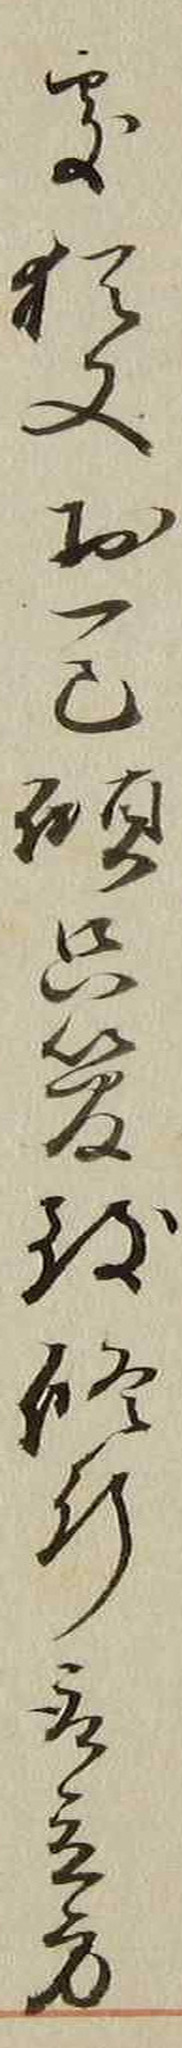処猶又於一己傾只管致修行取立方
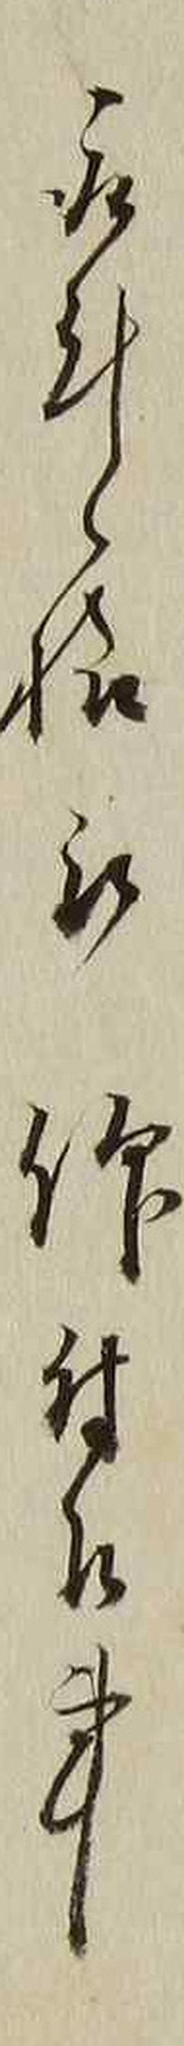取斗候様被仰付候事
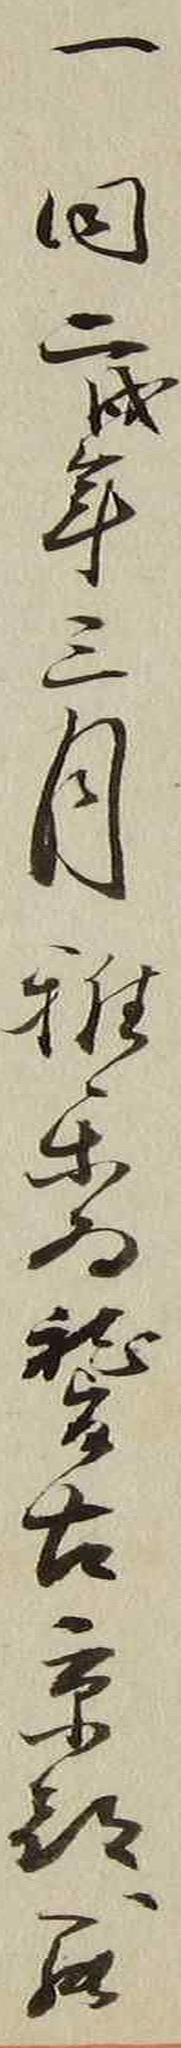一同二戌年三月雅楽為稽古京都へ罷
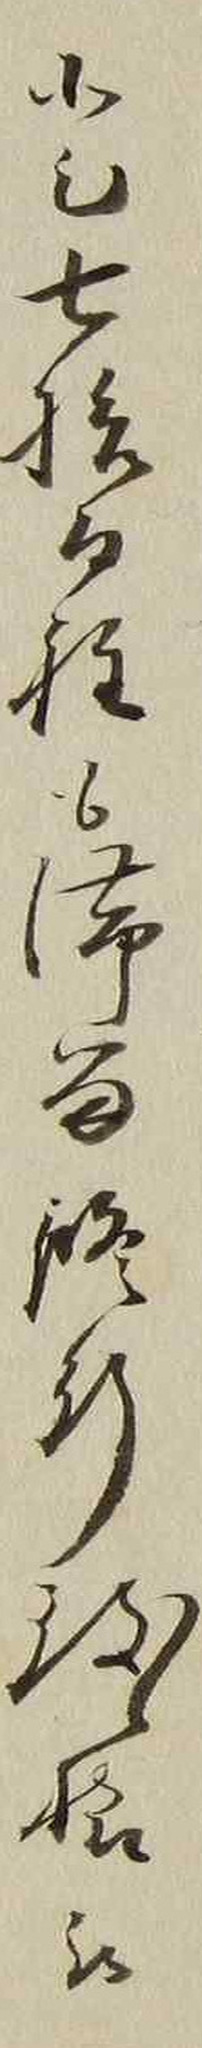登七拾日程も滞留修行致候様被
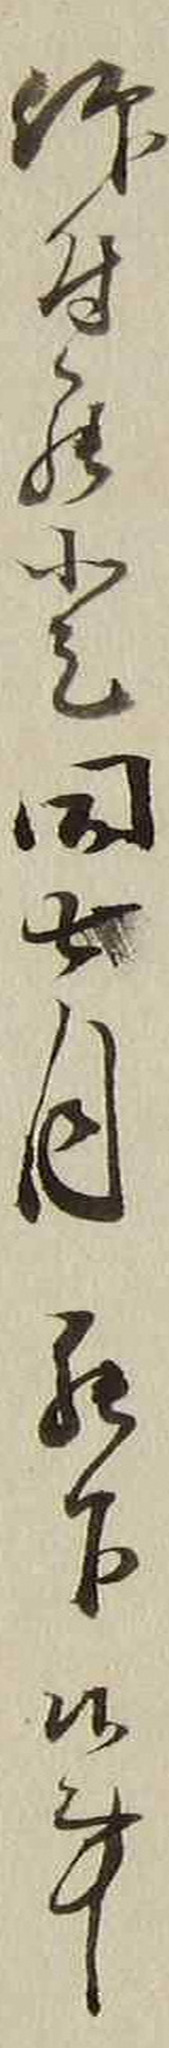仰付罷登同七月罷下候事
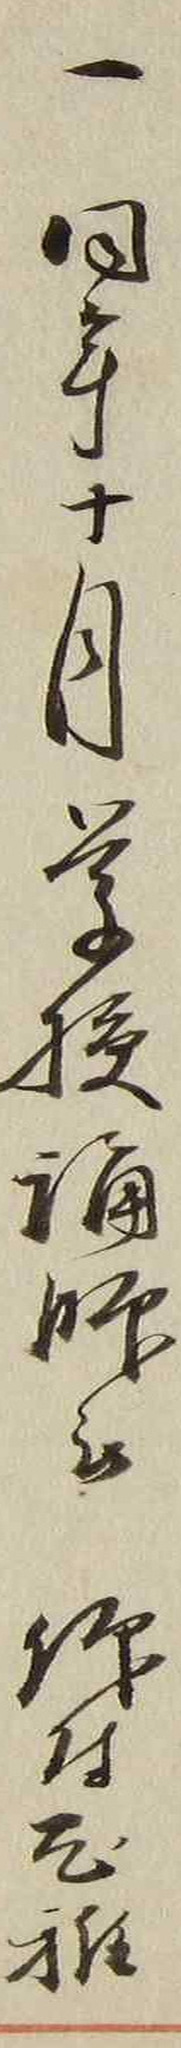一同年十月学校誦師被仰付尤雅
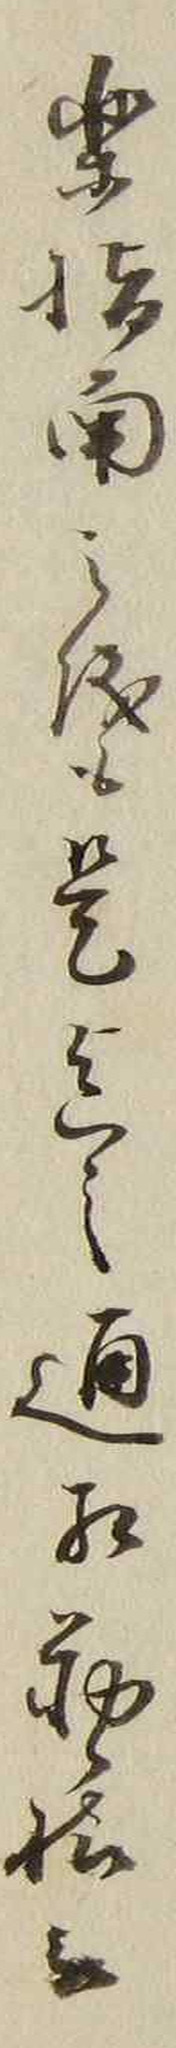楽指南之儀も是迄之通相勤候様被

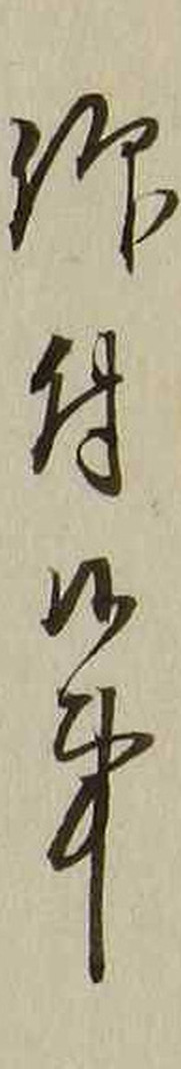仰付候事
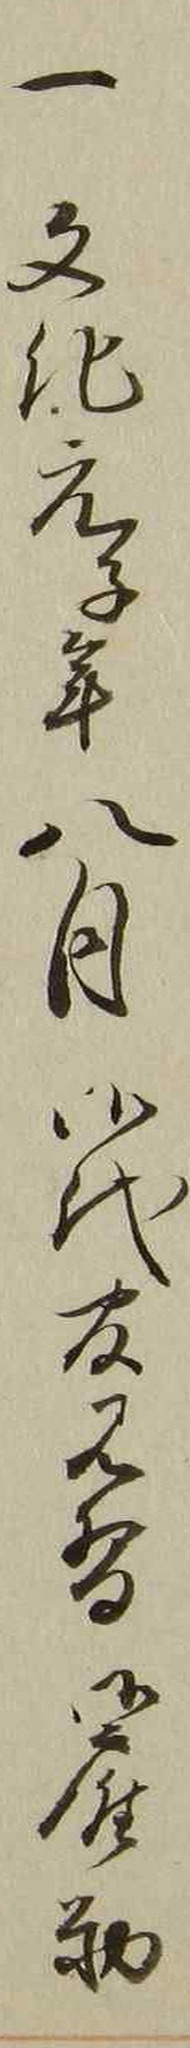一文化元子年八月御代官見習御雇勤
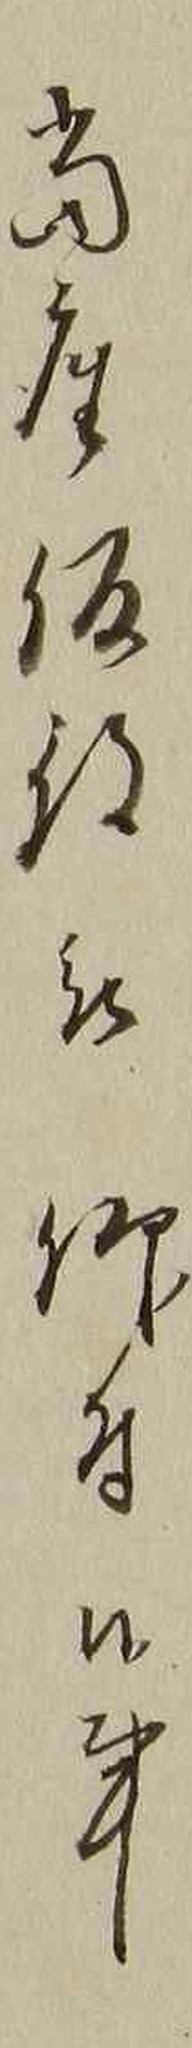当座仮役被仰付候事
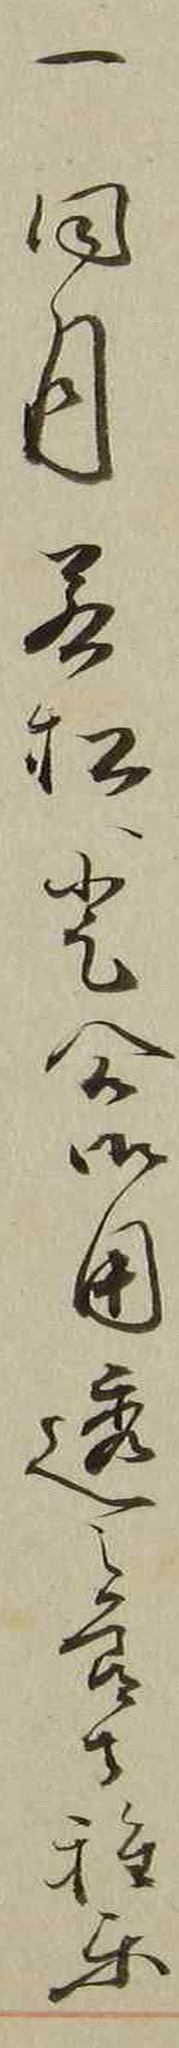一同月若松へ登合御用透之節者雅楽
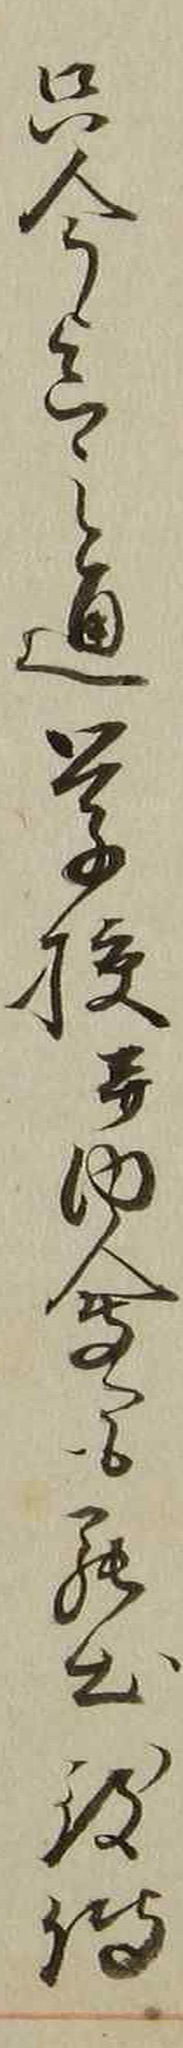只今迄之通学校并内会へも罷出致伝
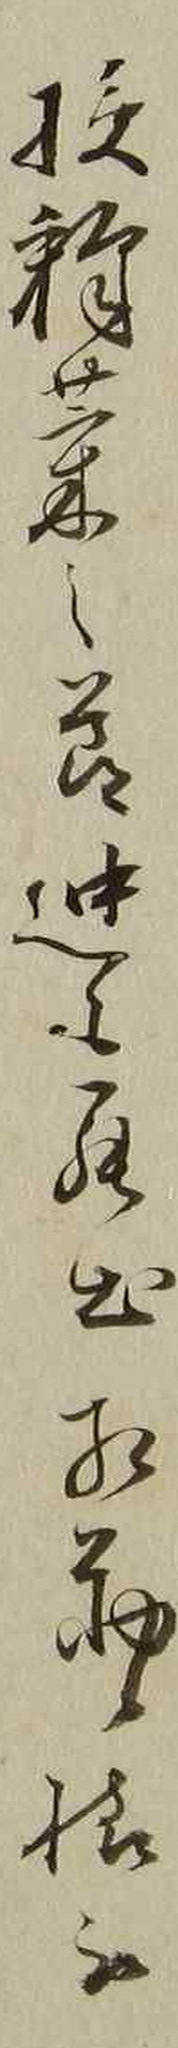授釈菜之節迚も罷出相勤候様被
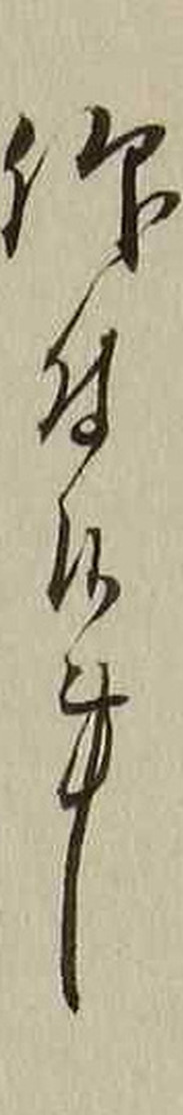仰付候事
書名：諸士系譜　巻之204　や之部1
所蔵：会津若松市立会津図書館
